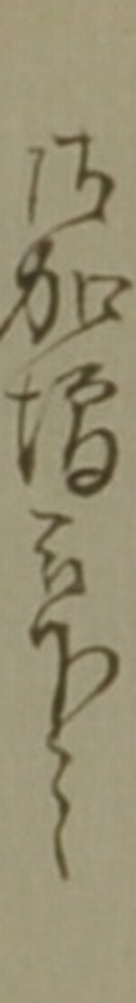御加増被下之

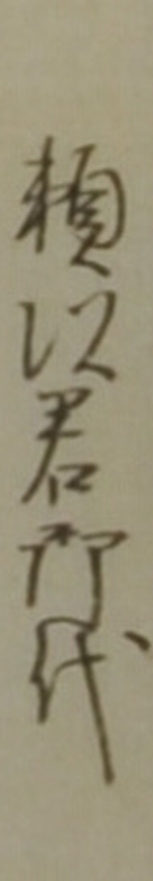頼以君御代
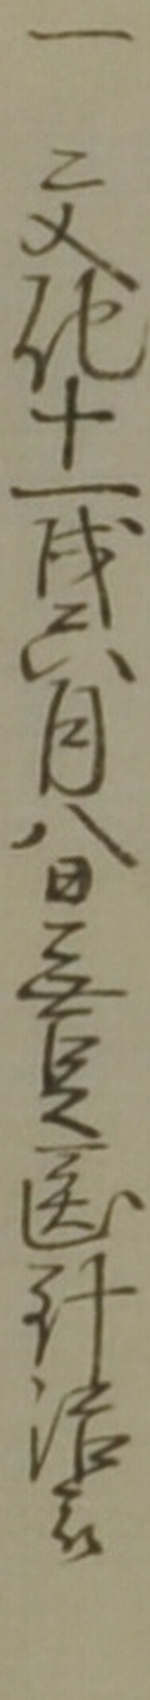一文化十一戌六月八日無足医針治被
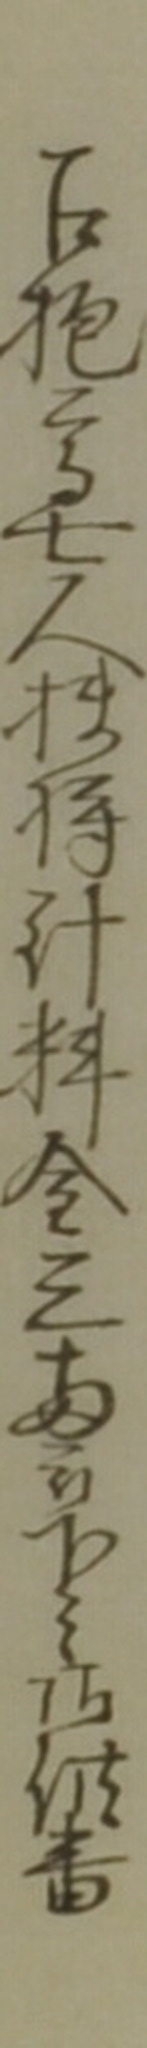召抱高七人扶持針料金三両被下之御供番
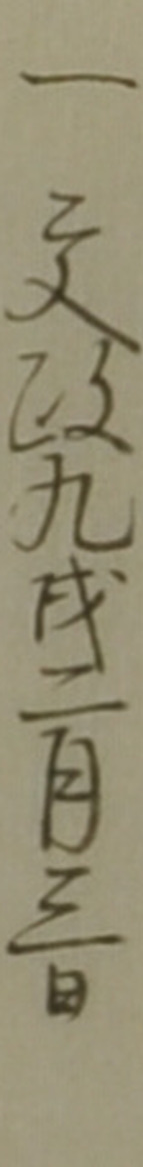一文政九戌二月三日
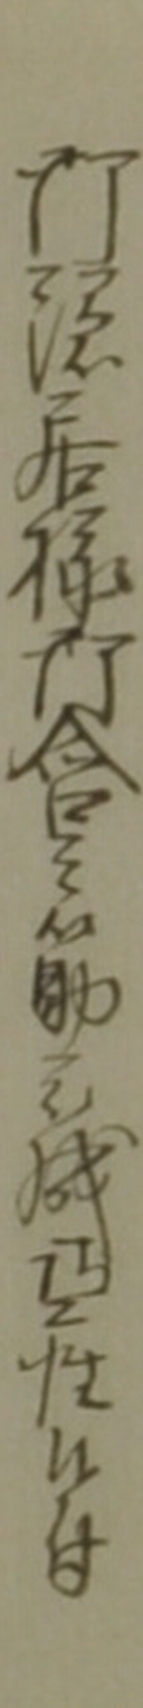御隠居様御含之筋被成御座候付
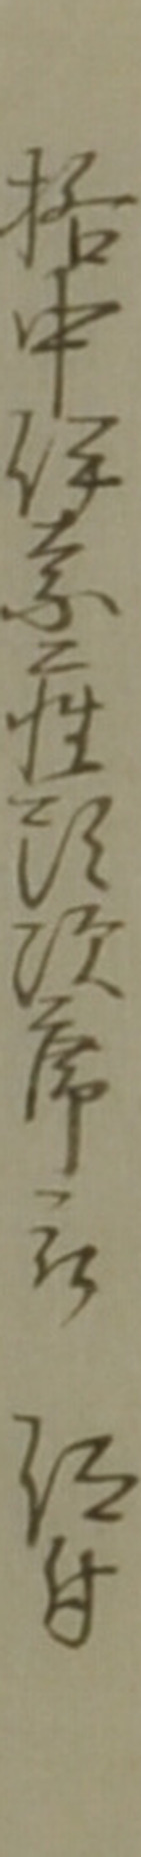格中伊奈座頭次席被仰付
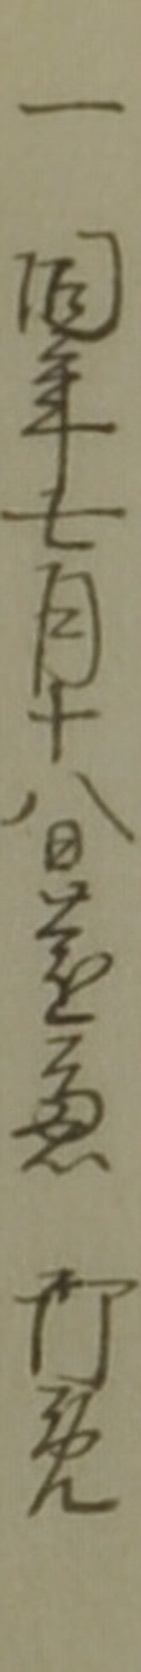一同年七月十八日遠慮御免
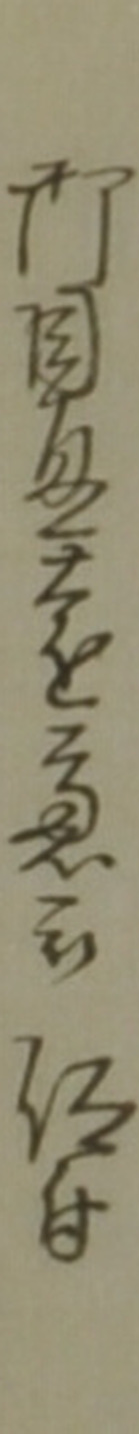御目通遠慮被仰付
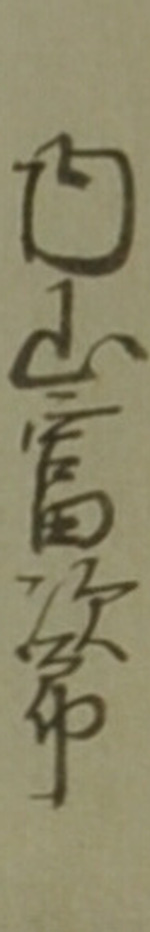内山富次郎
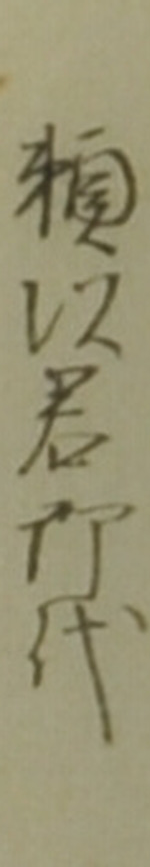頼以君御代

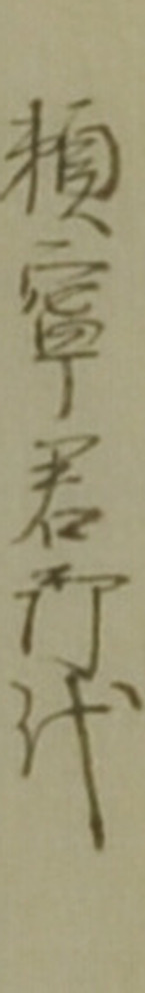頼寧君御代
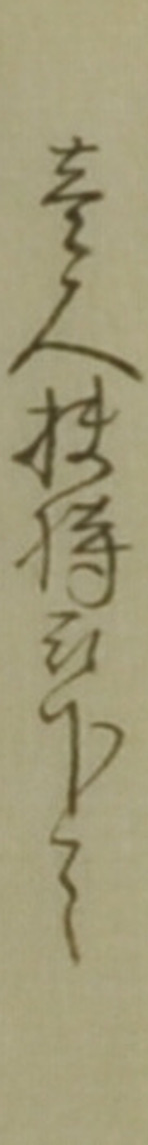壱人扶持被下之
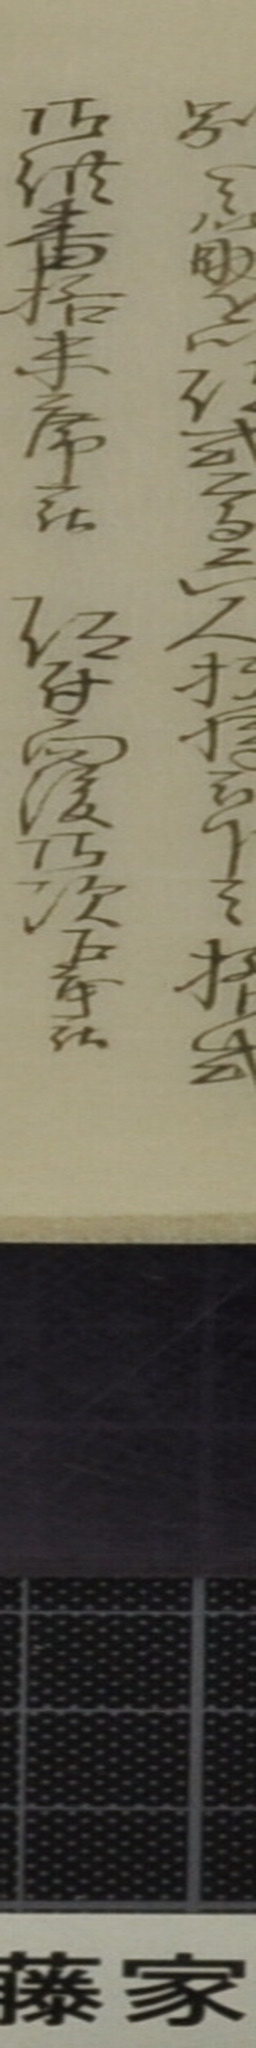御供番格末席被仰付向後御次江茂被
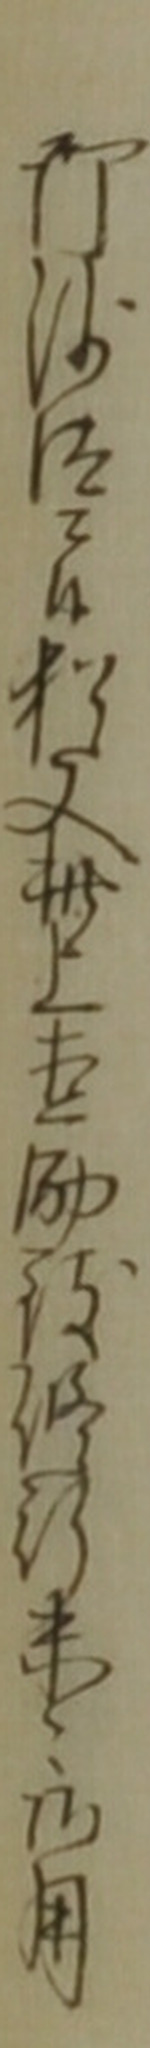御沙汰ニ付猶又此上相励致修行末々御用
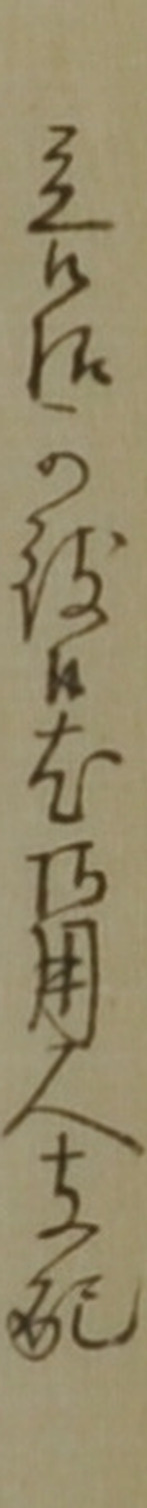立候様可致候尤御用人支配
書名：無足諸士勤仕録（六）
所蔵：伊那市立高遠町図書館・合同会社AMANE
